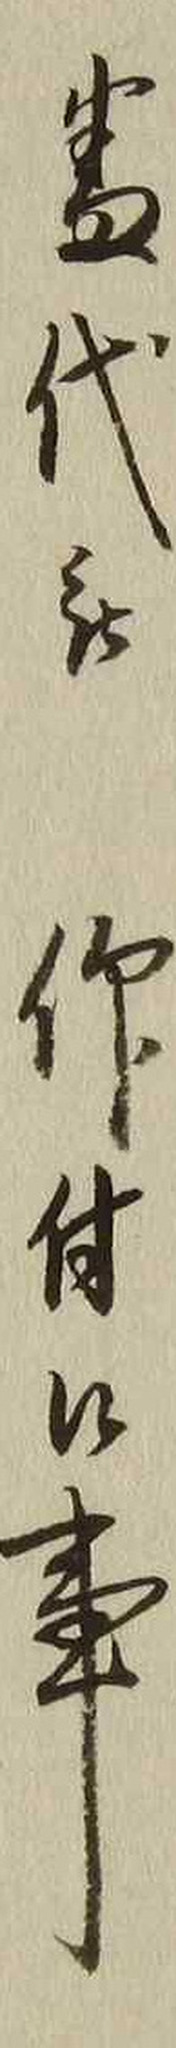番代被仰付候事
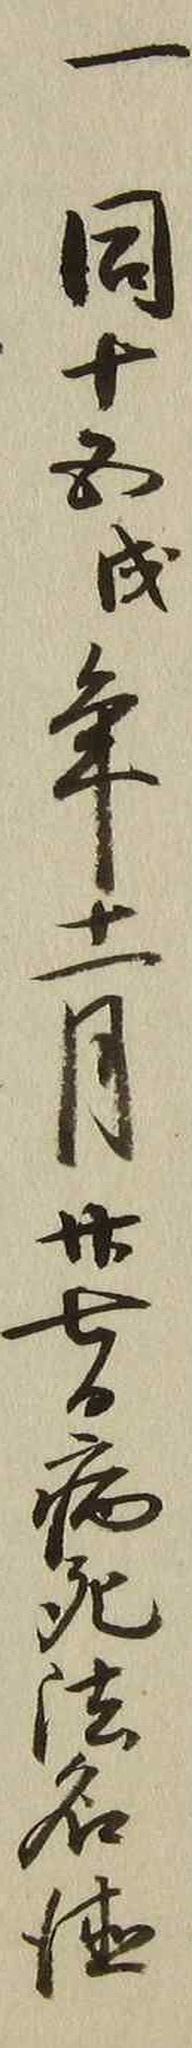一同十五戌年十一月廿七日病死法名徳
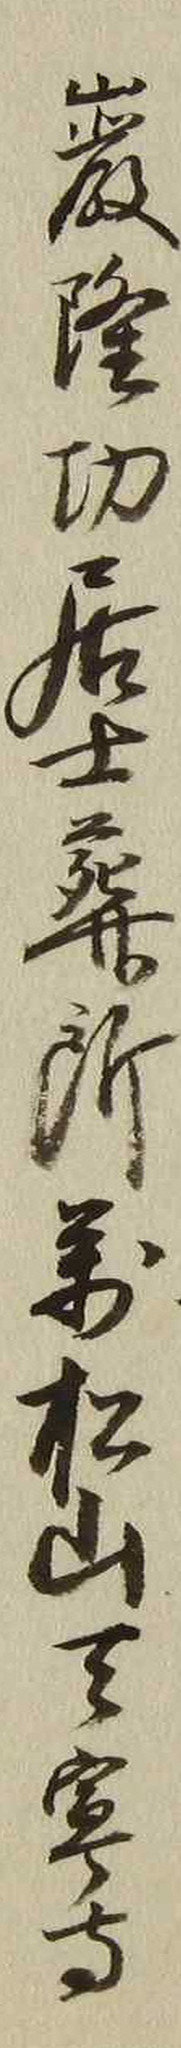巌隆功居士葬所万松山天寧寺
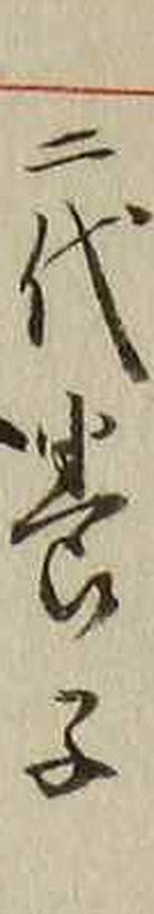二代養子
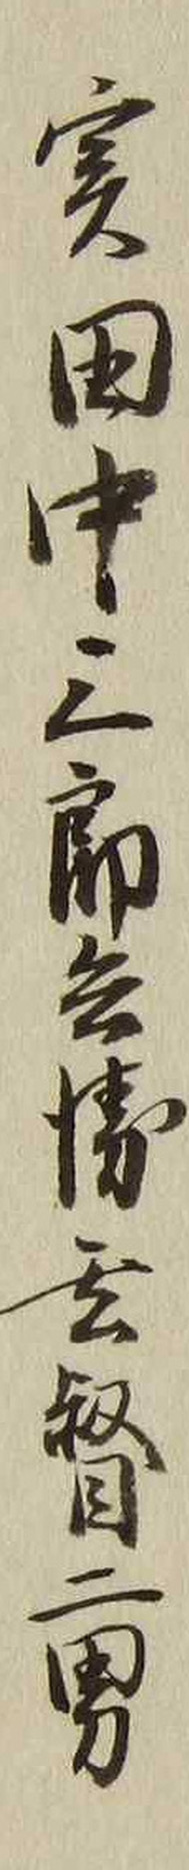実田中三郎兵衛玄督二男
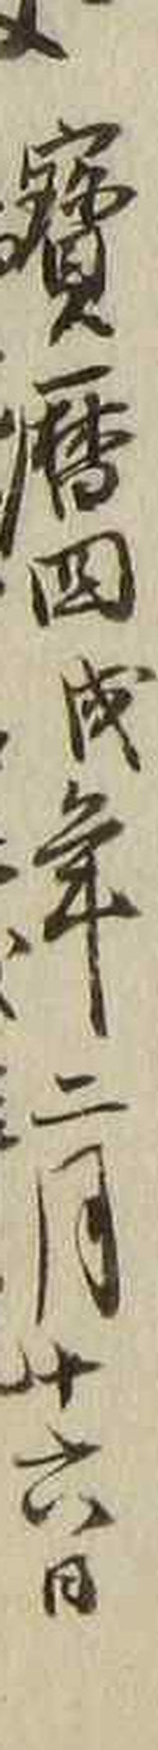宝暦四戌年二月十六日
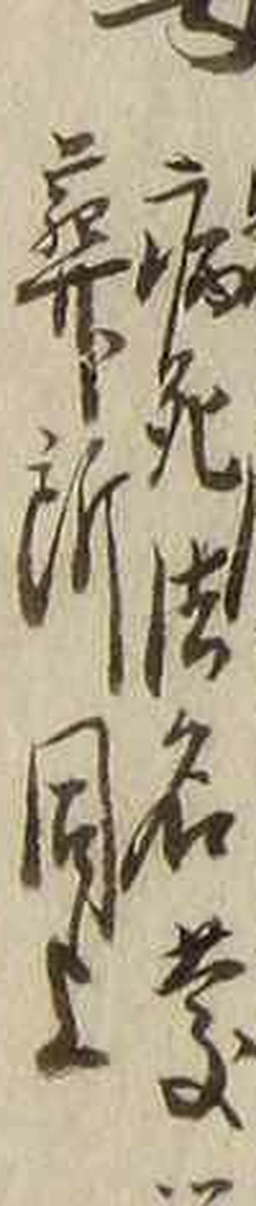葬所同上

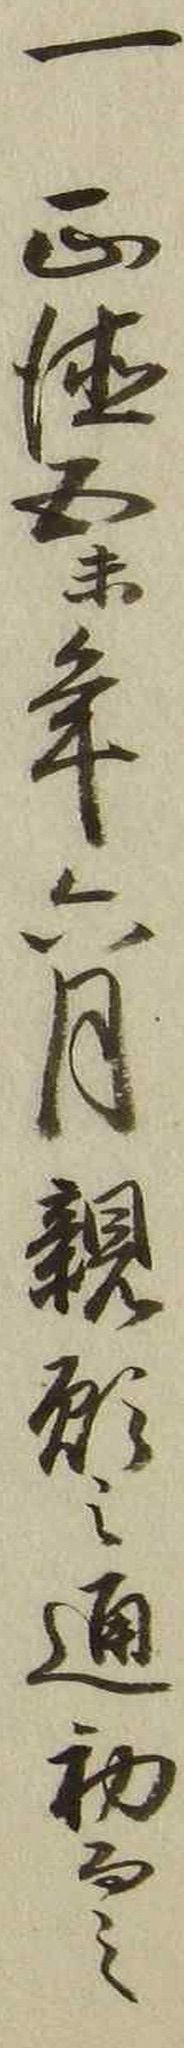一正徳五未年六月親願之通初而之
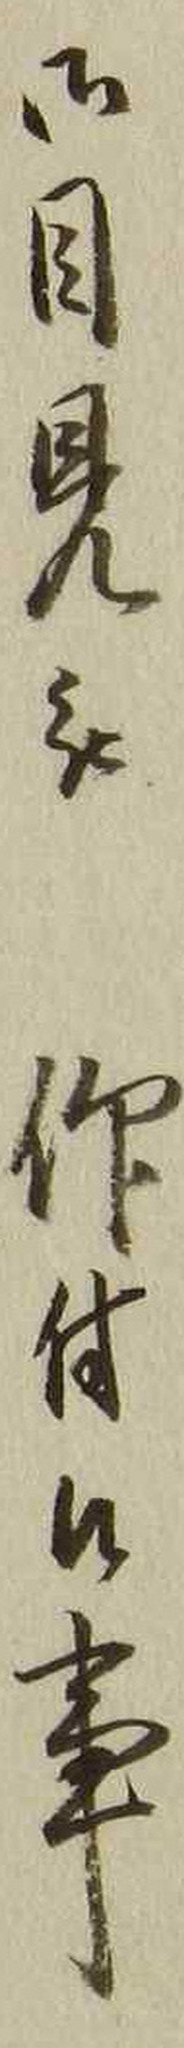御目見被仰付候事
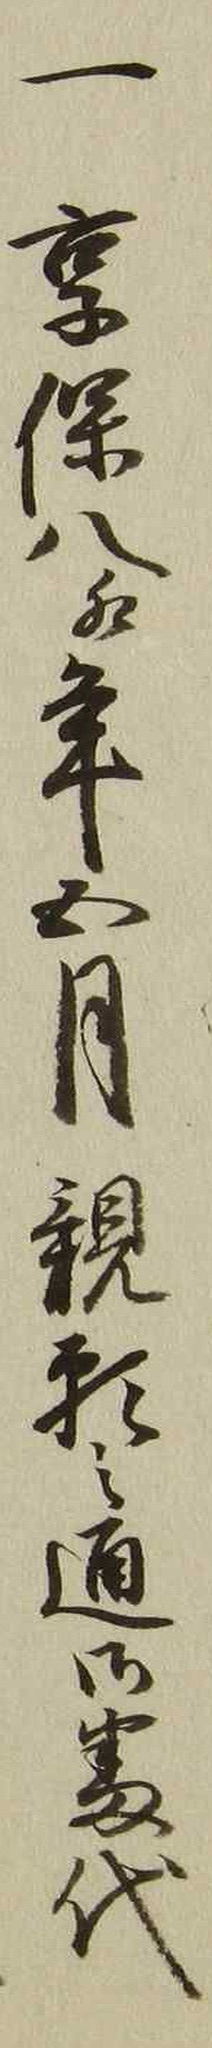一享保八卯年五月親願之通御番代
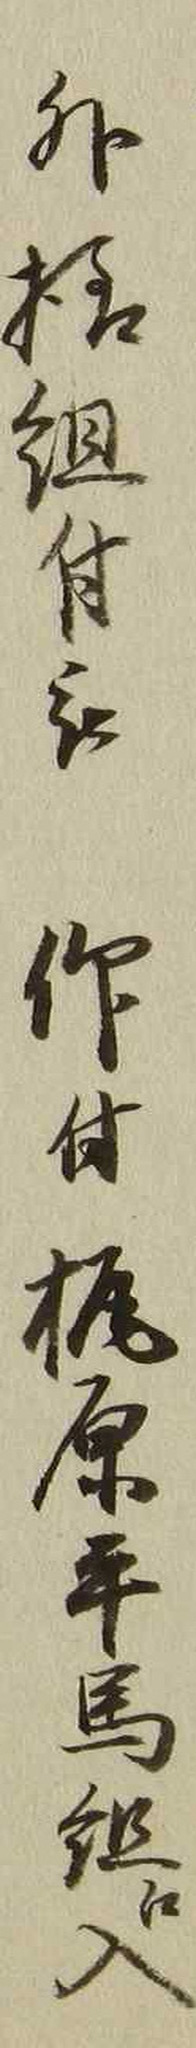外様組付被仰付梶原平馬組江入
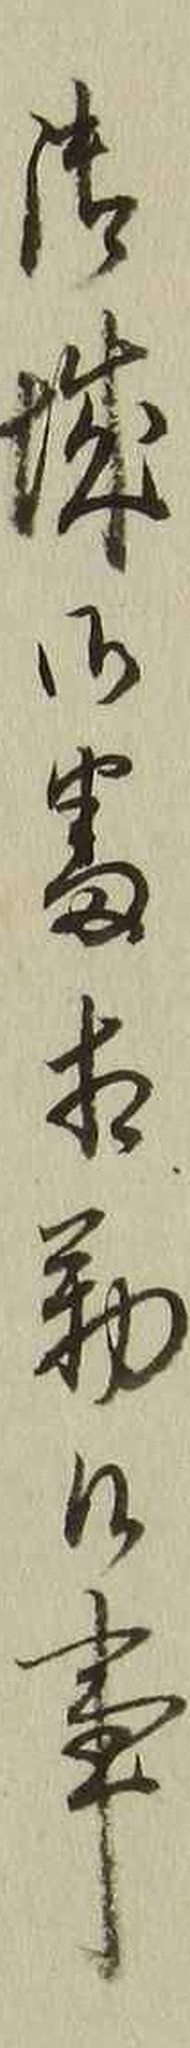御城御番相勤候事
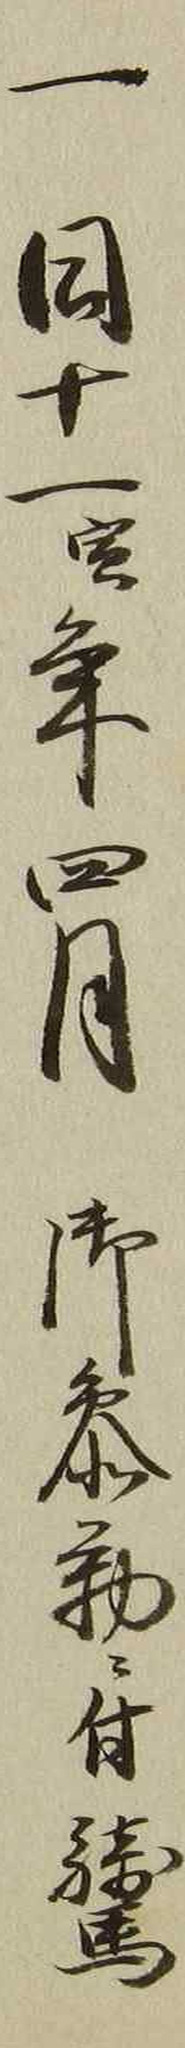一同十一寅年四月御参勤に付騎馬
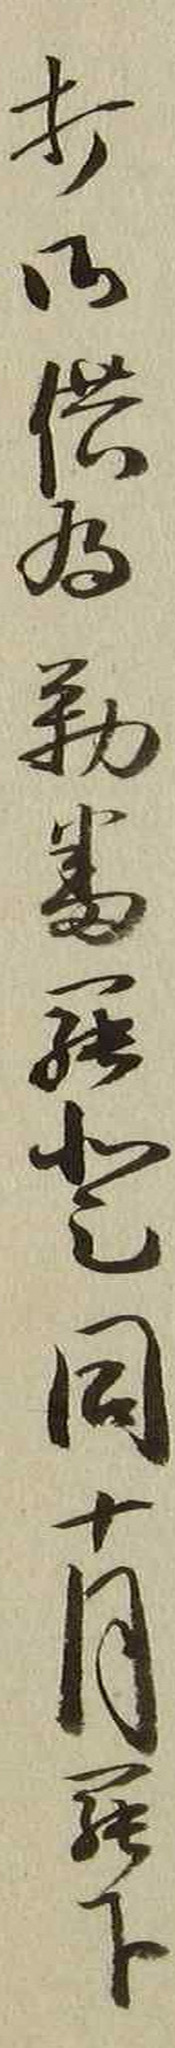打御供為勤番罷登同十月罷下
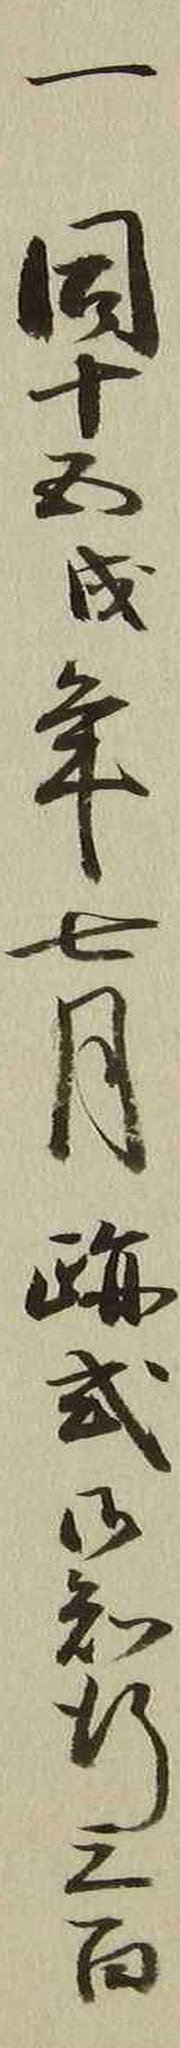一同十五戌年七月跡式御知行三百
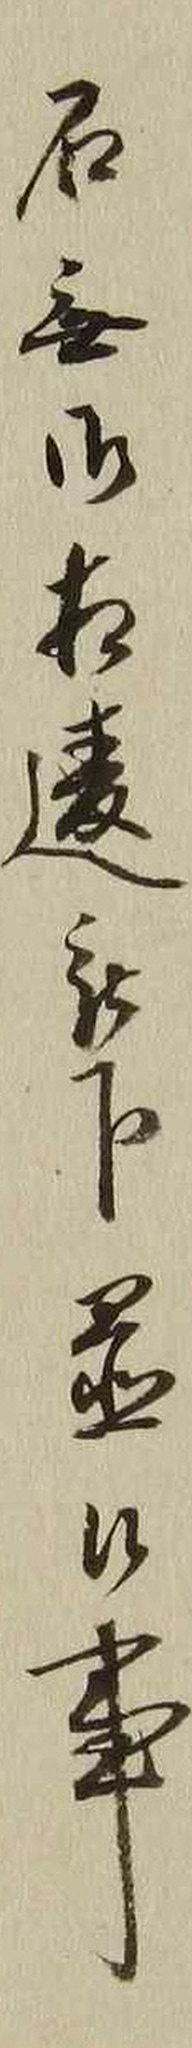石無御相違被下置候事
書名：諸士系譜　巻之133　た之部9
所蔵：会津若松市立会津図書館
